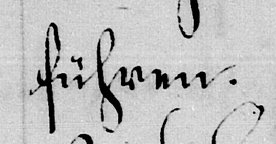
führen.
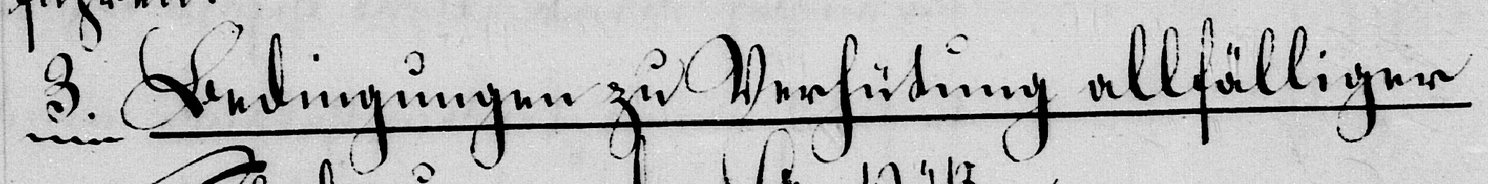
3. Bedingungen zu Verhütung allfälliger
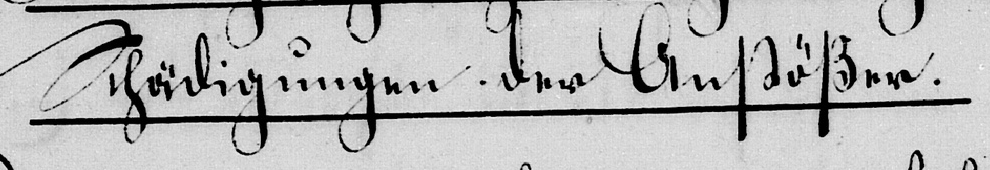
Schädigungen der Anstößer.
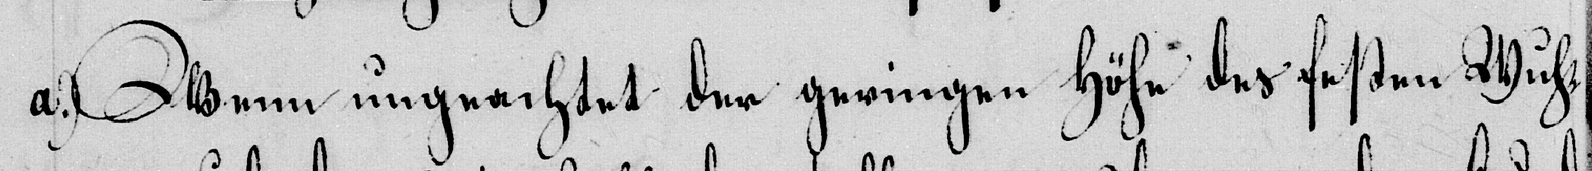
a.) Wenn ungeachtet der geringen Höhe des festen Wuh¬
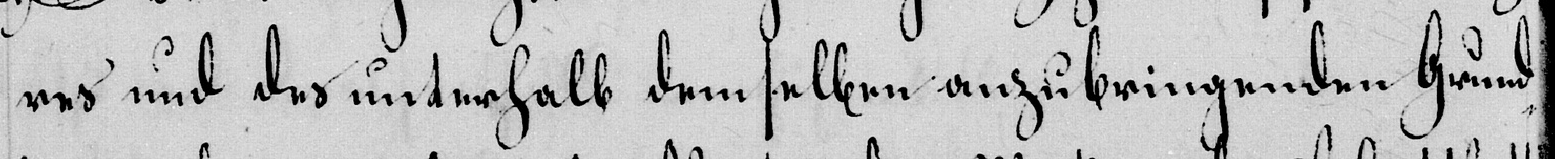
res und des unterhalb demselben anzubringenden Grund¬
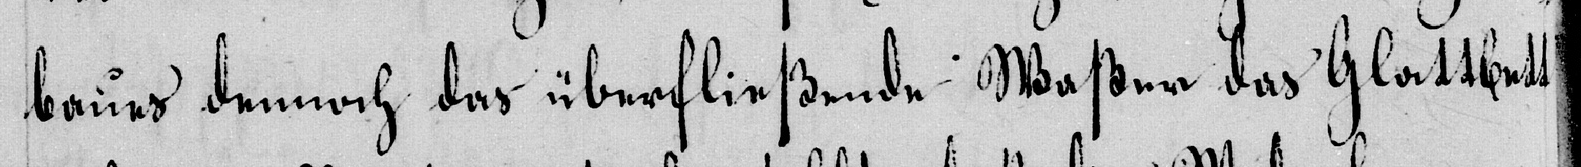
baues dennoch das überfließende Waßer das Glattbett
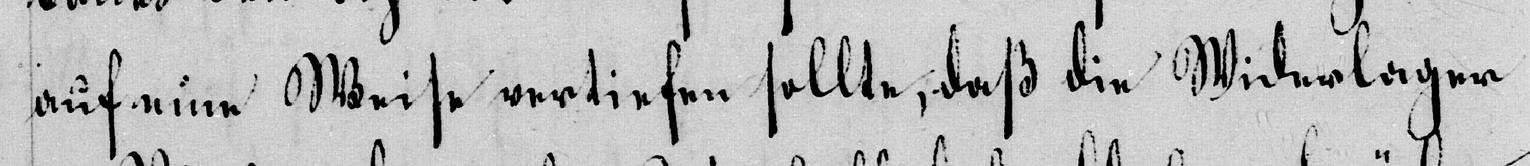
auf eine Weise vertiefen sollte, daß die Widerlager
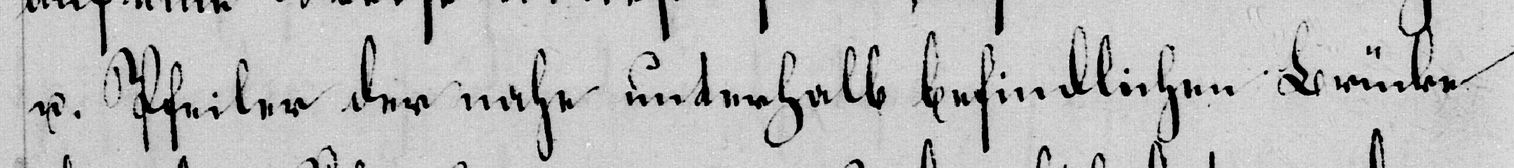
u. Pfeiler der nahe unterhalb befindlichen Brücke
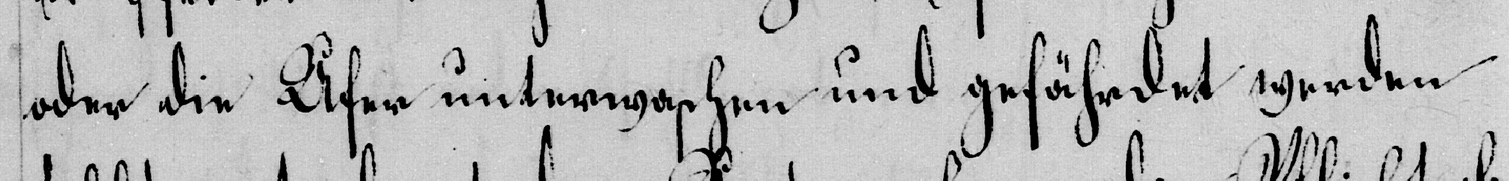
oder die Ufer unterwaschen und gefährdet werden
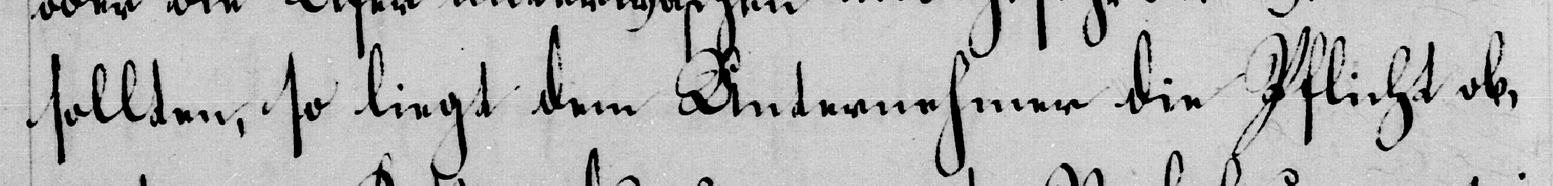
sollen, so liegt dem Unternehmer die Pflicht ob,
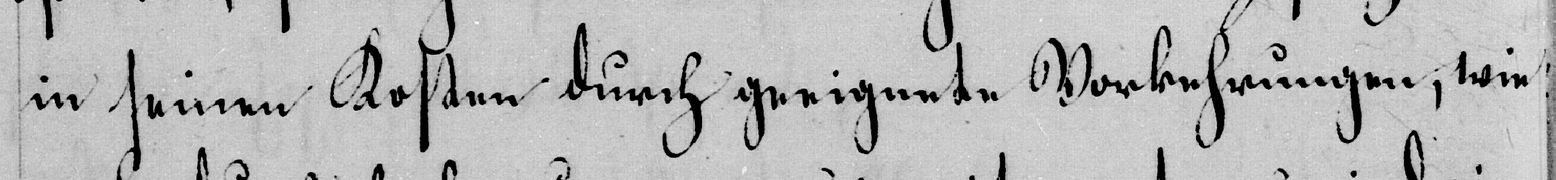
in seinen Kosten durch geeignete Vorkehrungen, wie
